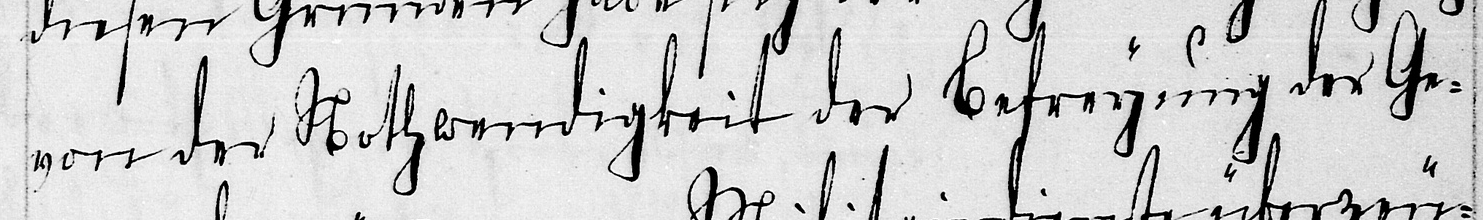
von der Nothwendigkeit der Befreyung der Ge¬
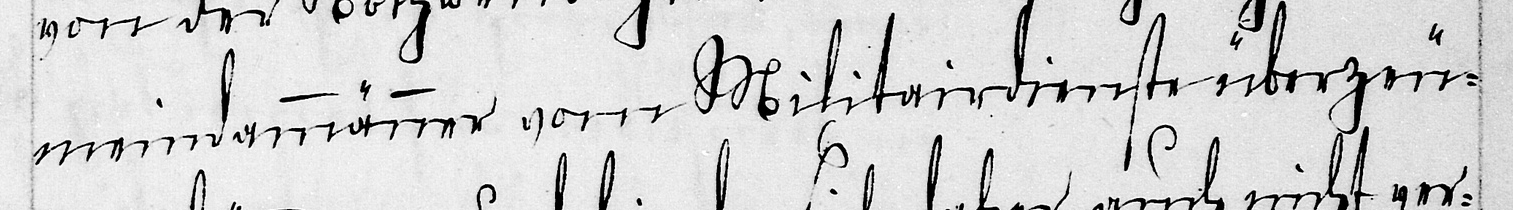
meindammänner vom Militairdienste überzeu¬
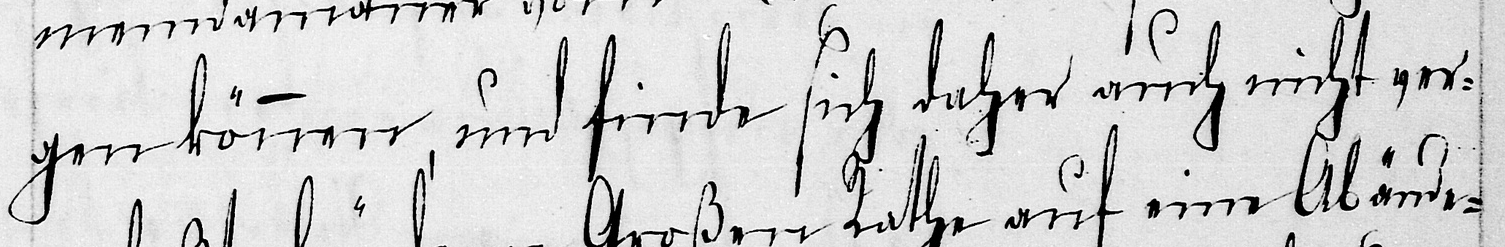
gen können, und finde sich daher auch nicht ver¬
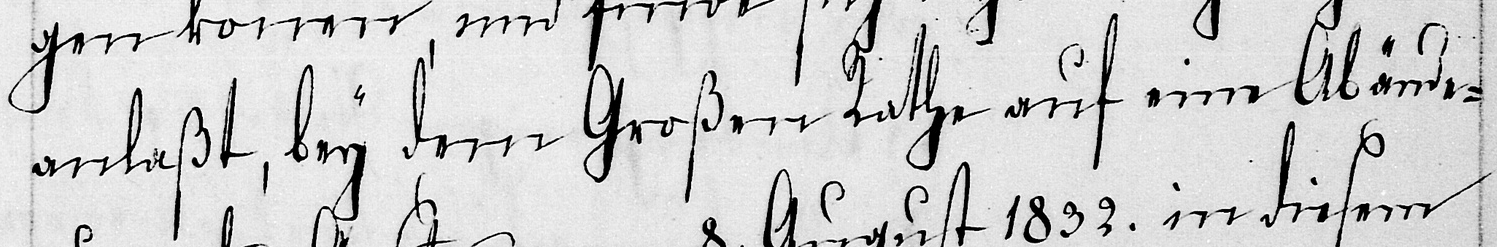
anlaßt, bey dem Großen Rathe auf eine Abände¬
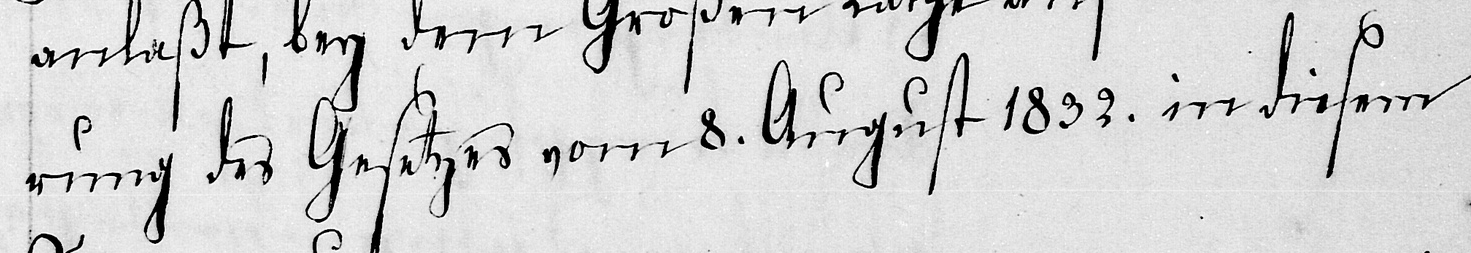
rung des Gesetzes vom 8. August 1832. in diesem
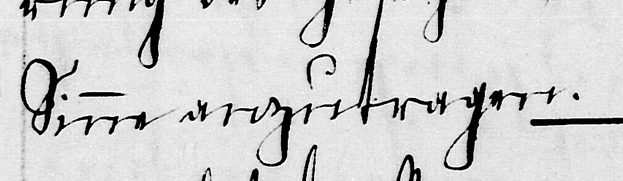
Sinne anzutragen.
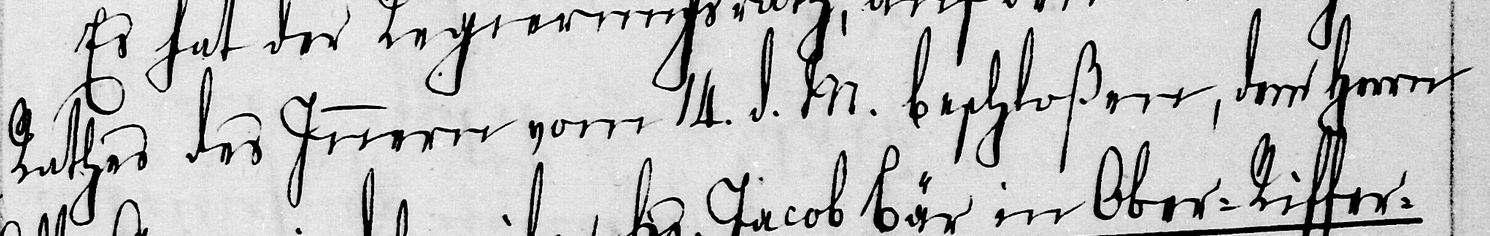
Rathes des Innern vom 14. d. M. beschloßen, dem Herrn
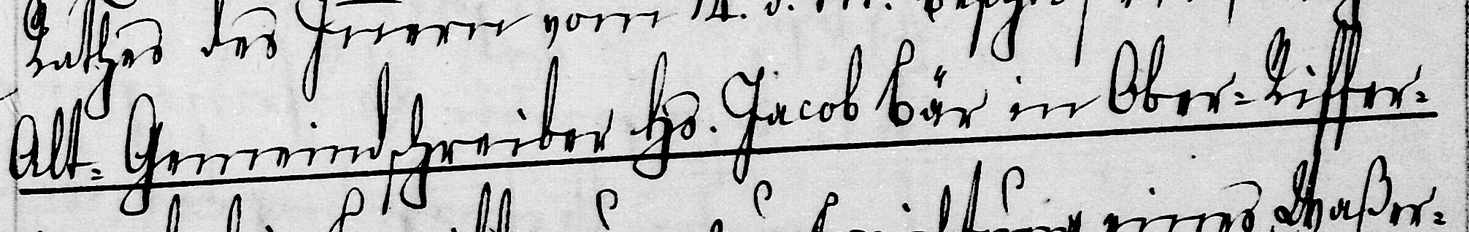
Alt-Gemeindschreiber Hs. Jacob Bär in Ober-Riffer¬
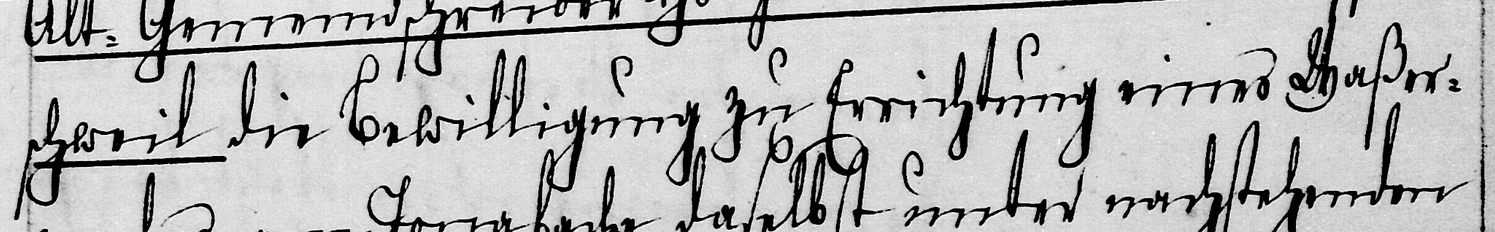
schweil die Bewilligung zu Errichtung eines Waßer¬
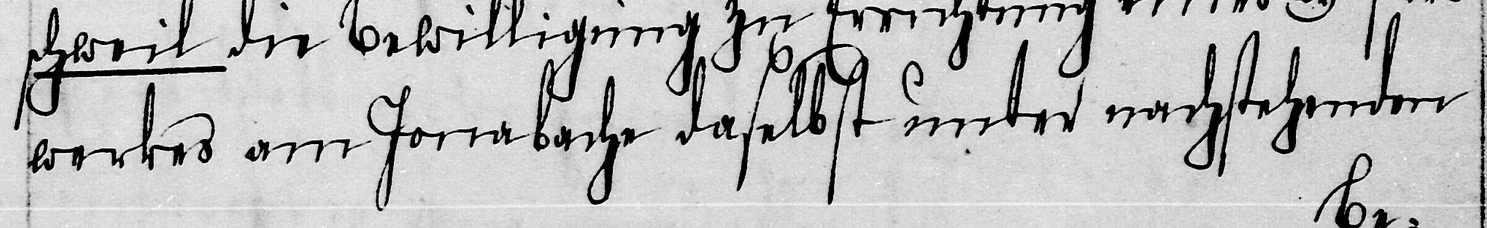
werkes am Jonabache daselbst unter nachstehenden
